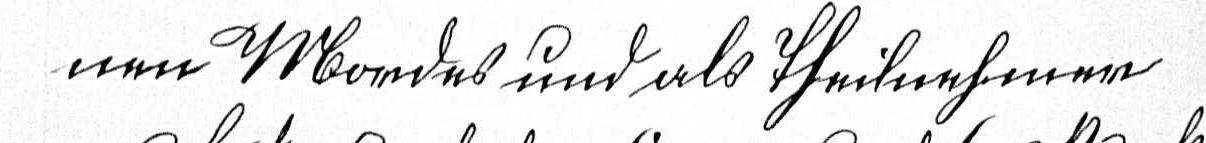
nen Mordes und als Theilnehmer
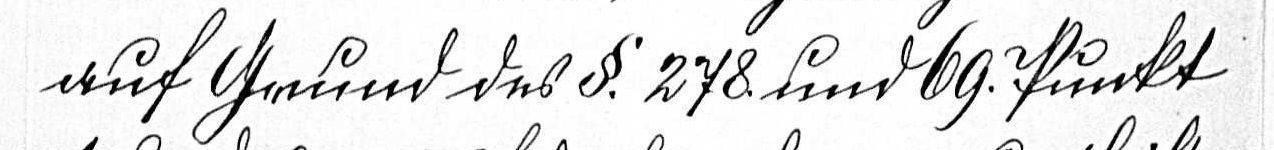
auf Grudn des §278 und 69 Punkt
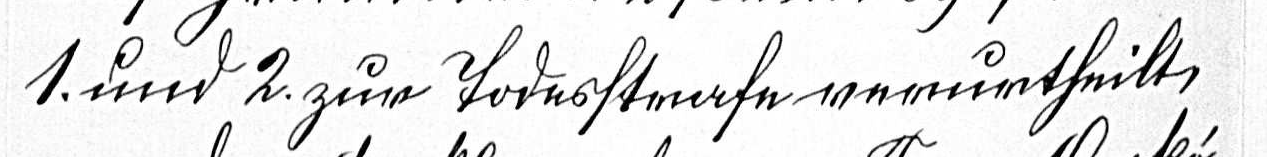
1. Und 2. Zur Todesstrafe verurtheilt,
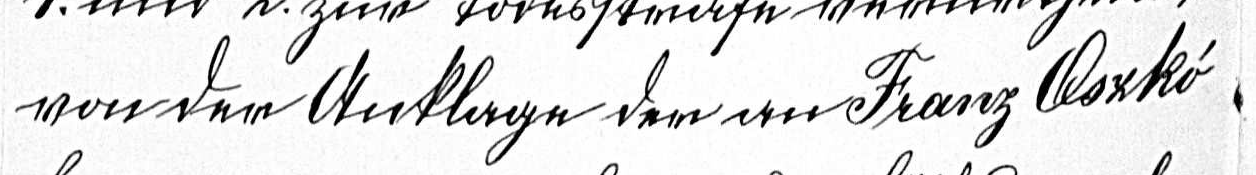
von der Anklage der an Franz Oszkó
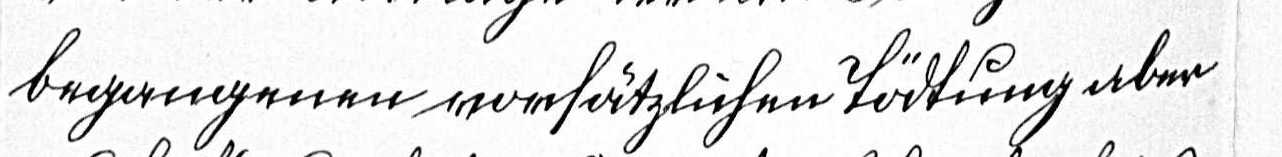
begangenen vorsätzlichen Tödtung aber
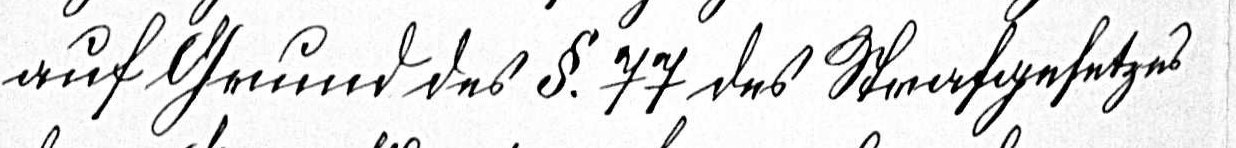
auf Grund des §77 des Strafgesetzes
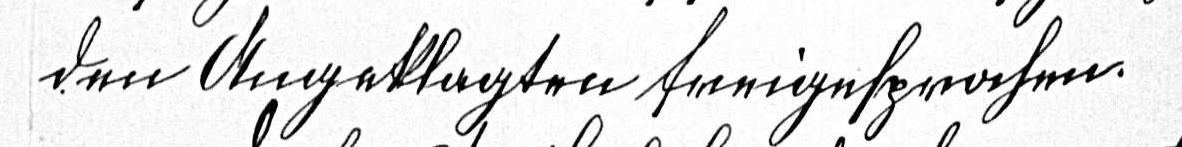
den Angeklagten freigesprochen.
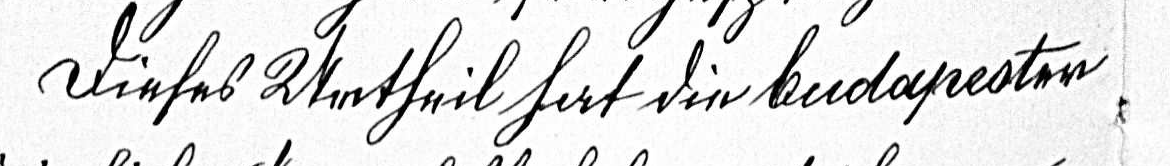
Dieses Urtheil hat die budapester
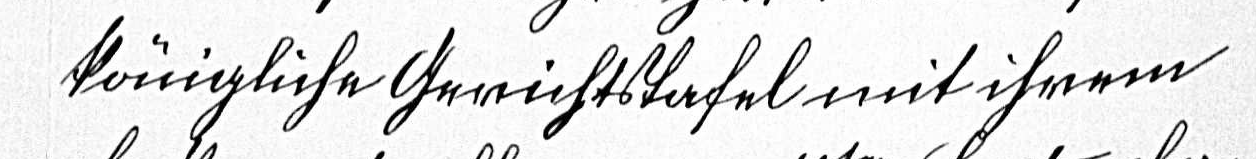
königliche Gerichtstafel mit ihrem
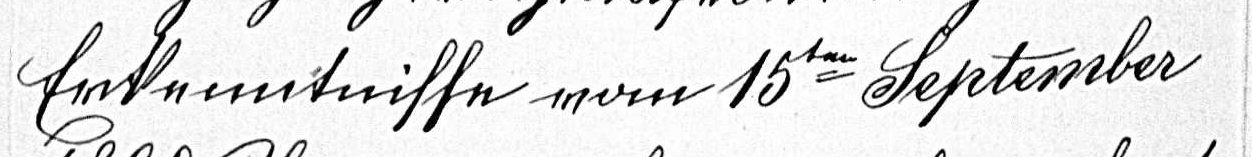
Erkenntnisse vom 15ten September
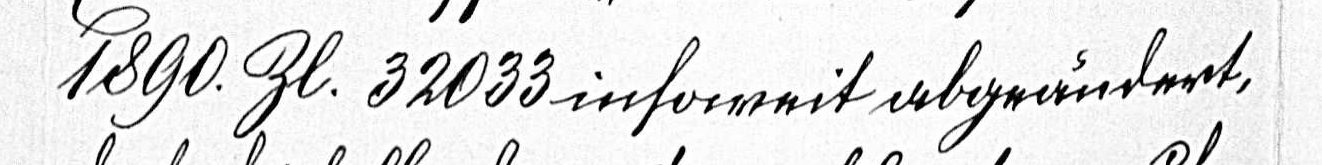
1890 Zl. 32033 infowei abgeändert,
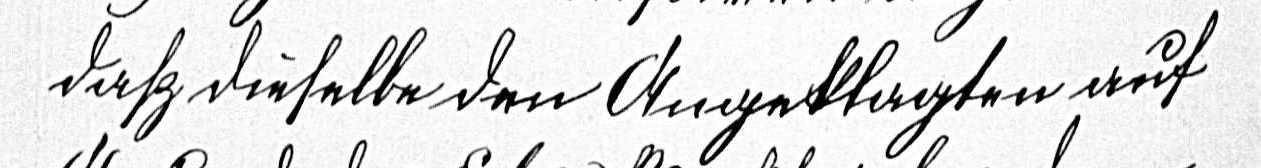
daß dieselbe den Angeklagten auf
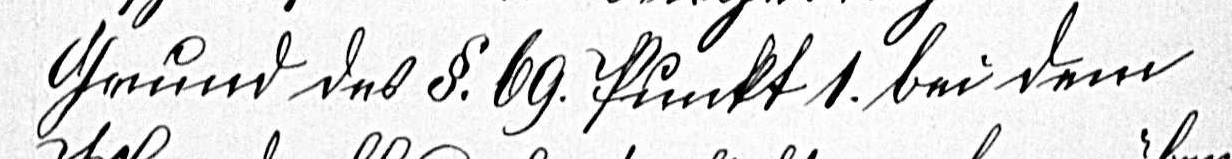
Grudn des §69 Punkt 1. Bei dem
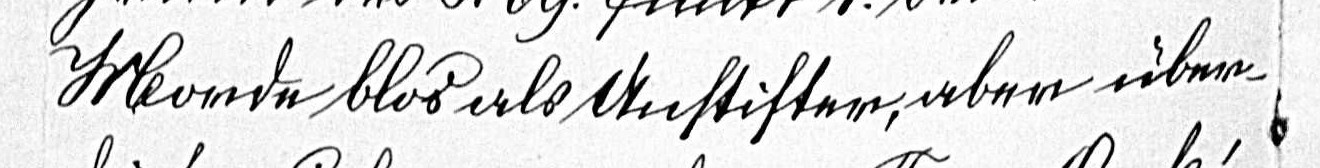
Morde blos als Austifter, aber über¬
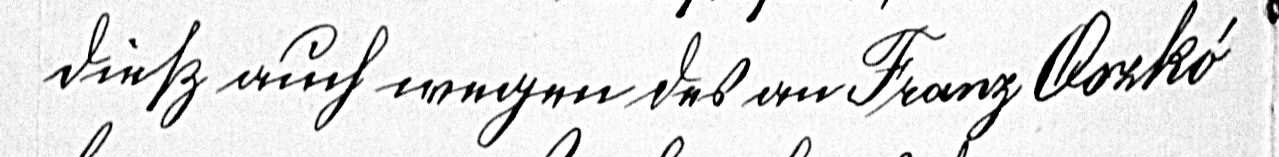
dieß auch wegen des an Franz Oszkó
